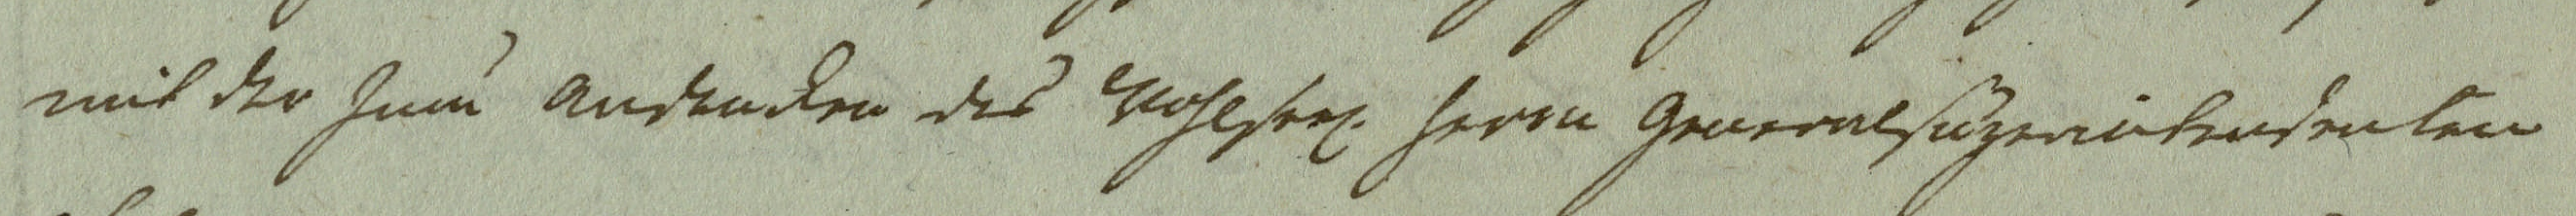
mit der zum Andencken des Wohlseel. herrn Generalsuperintendenten
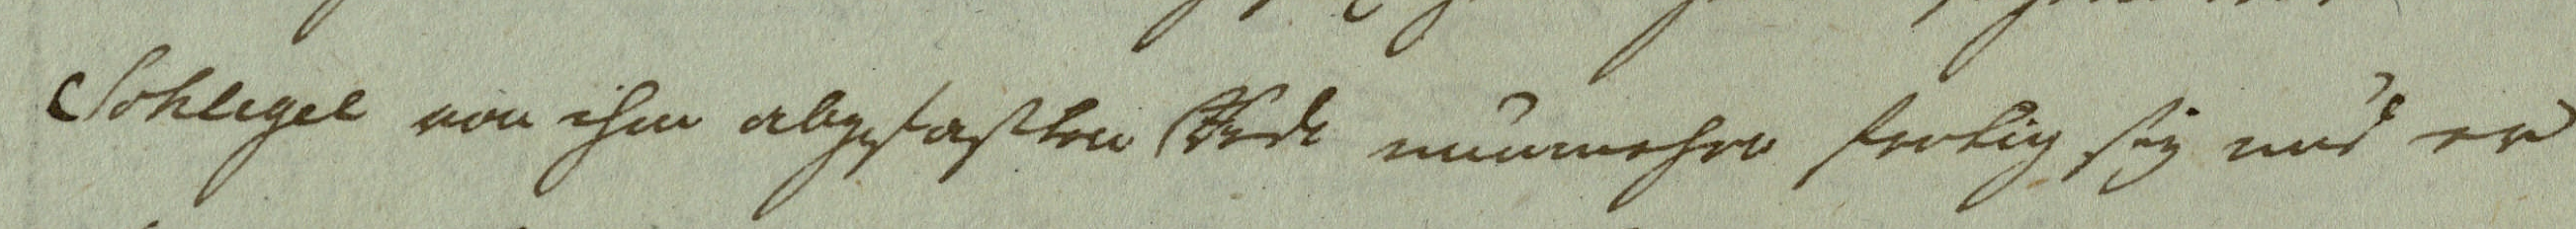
Schlegel von ihm abgefaßten Rede nunmehro fertig seÿ und er
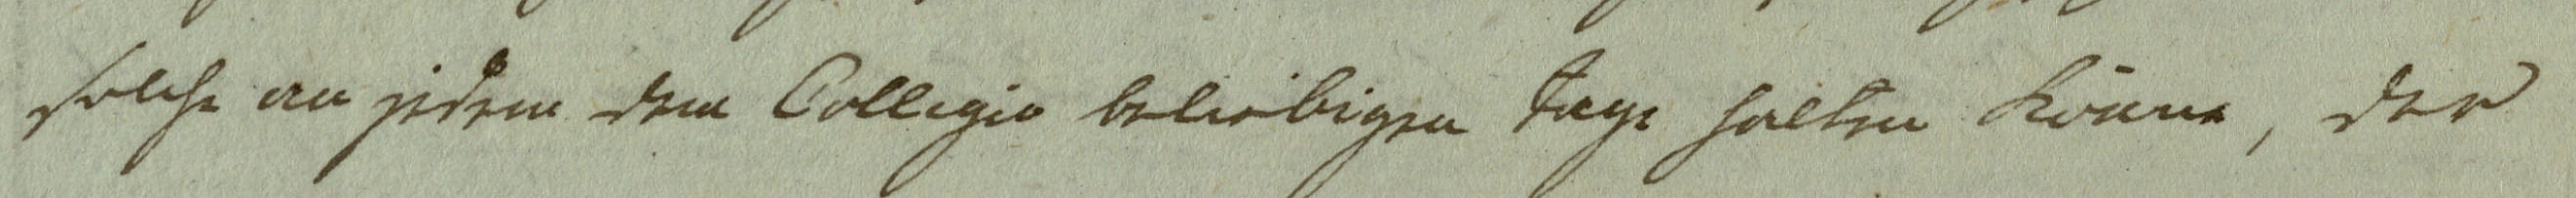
solche an jedem dem Collegio beliebigen Tage halten könne, der
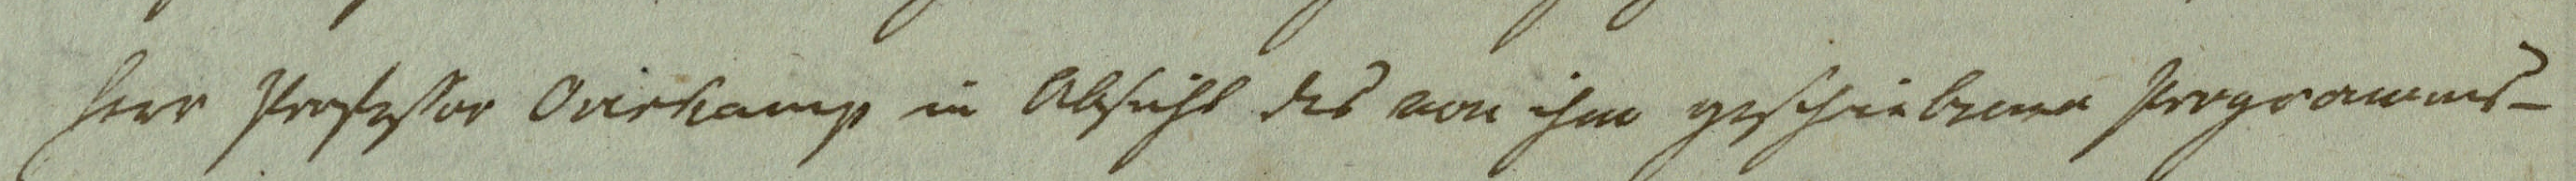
herr Professor Overkamp in Absicht des von ihm geschriebenen Programms,
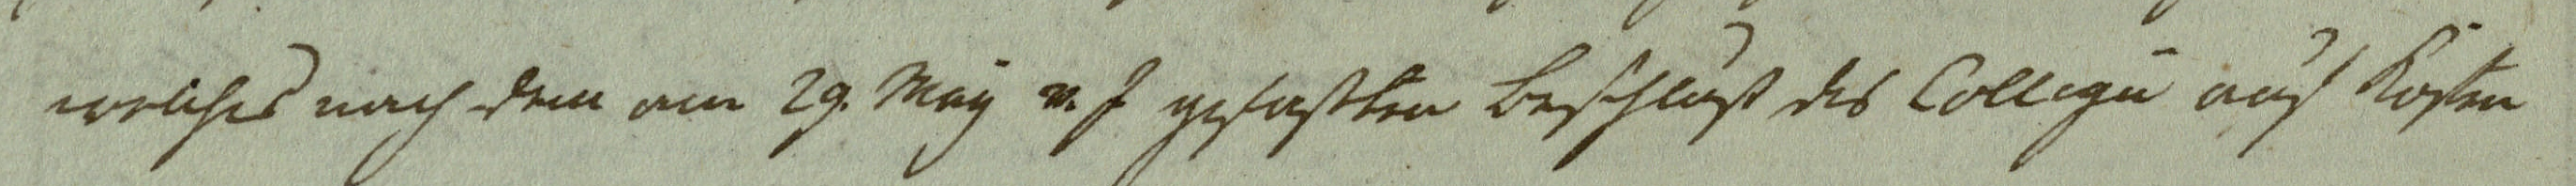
welches nach dem am 29. Maÿ v. J. gefaßten Beschluß des Collegii auf Kosten
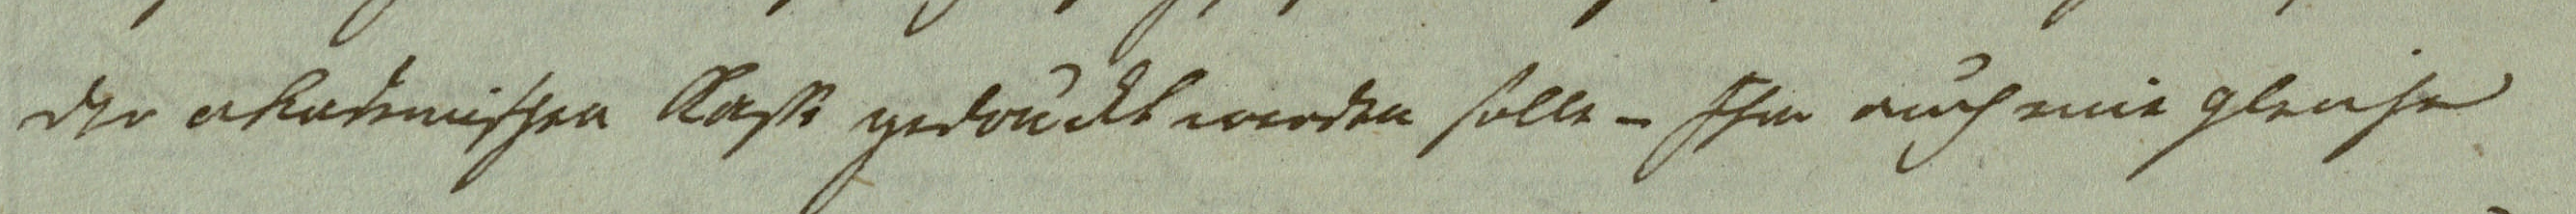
der akademischen Kasse gedruckt werden solle, Ihm auch eine gleiche
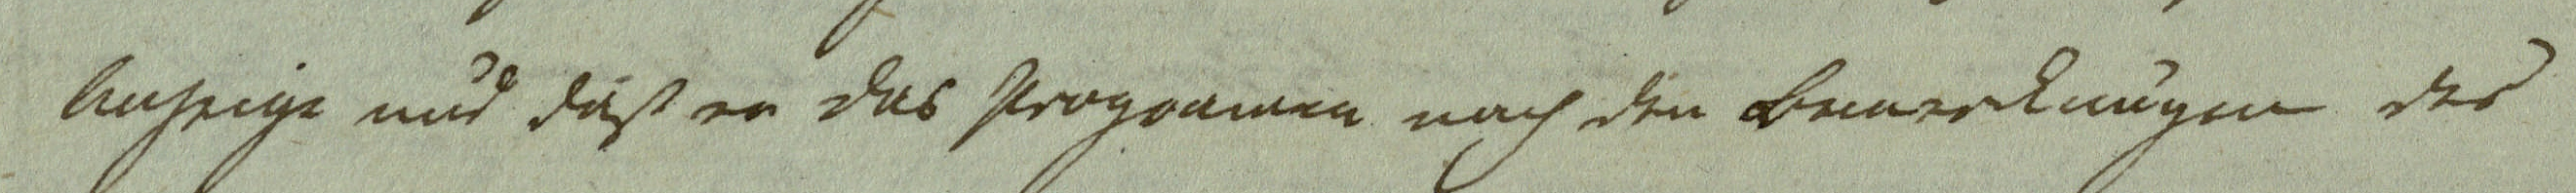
Anzeige und daß er das Programm nach den Bemerckungen des
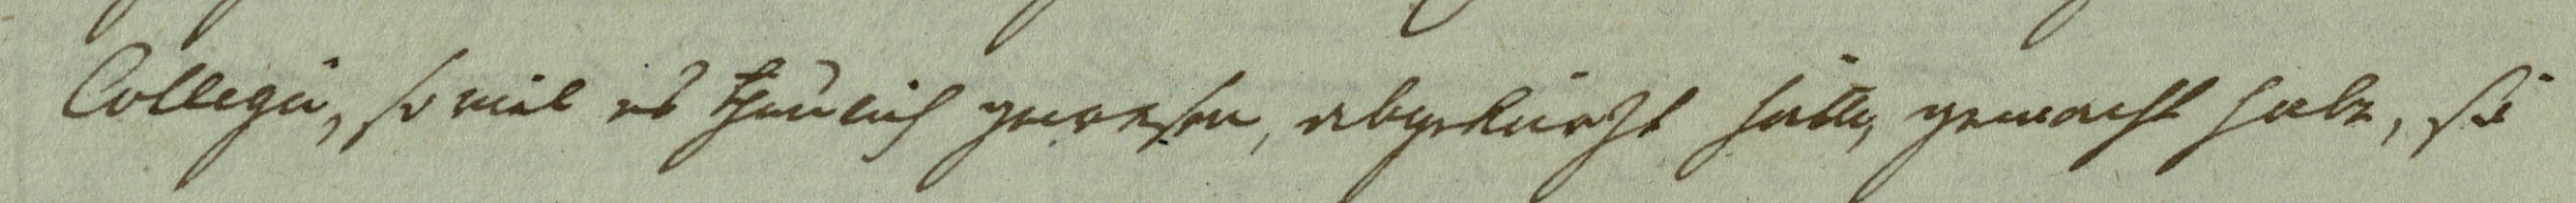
Collegii , so viel es thunlich gewesen, abgekürzt hätte, gemacht habe, so
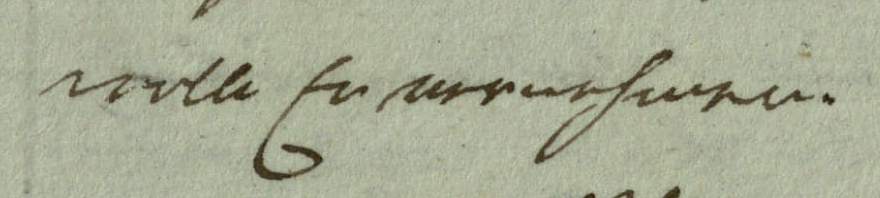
wolle Er vernehmen:
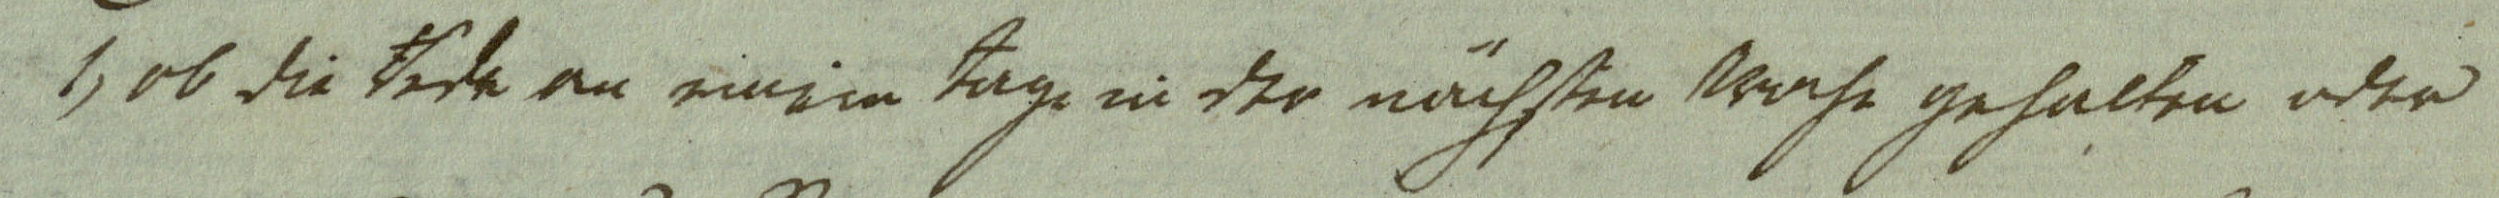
1, ob die Rede an einem Tage in der nächsten Woche gehalten oder
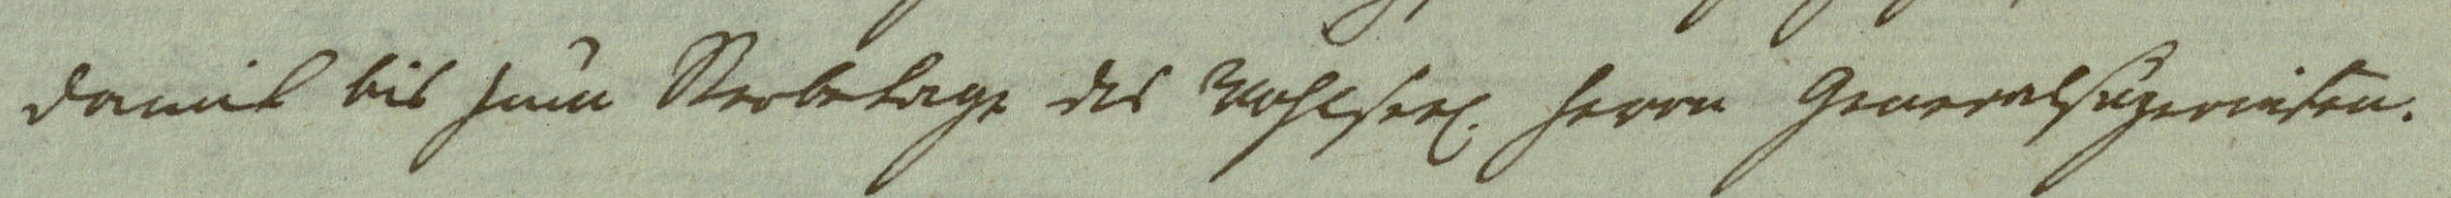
damit bis zum Sterbetage des Wohlseel. herrn Generalsuperinten¬
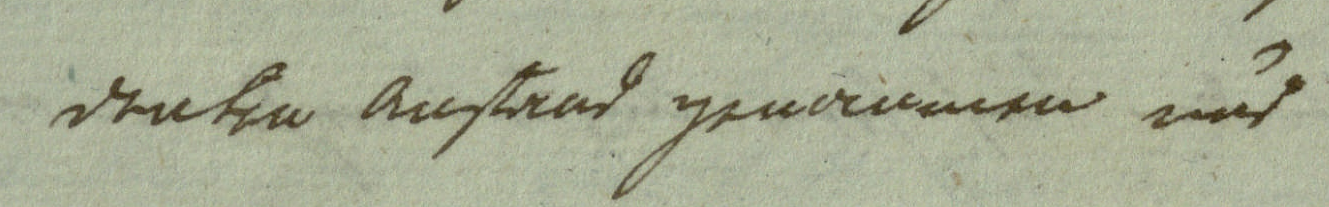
denten Anstand genommen und
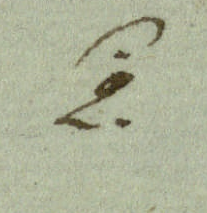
2.
